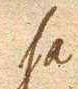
sa
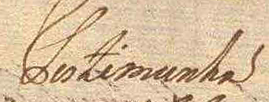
Testimunha
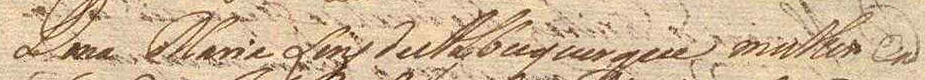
Dona Maria Lins de Albuquerque mulher ca
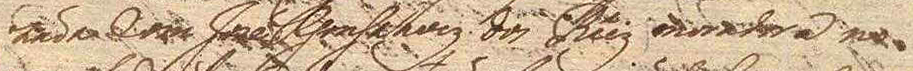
zada com Joze Gonsalves dos Reiz moradora no
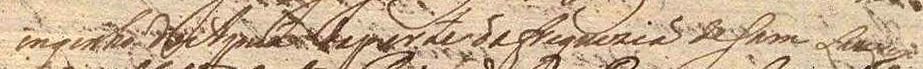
engenho do Apuá da parte da freguezia de sam Louren
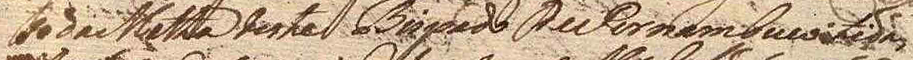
so da Matta deste Bispado de Pernambuco tida
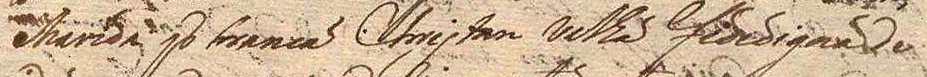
e havida p̄ branca Christan velha fidedigna de
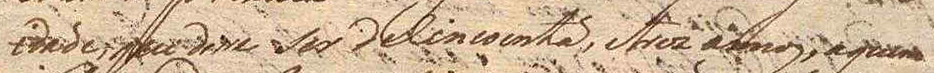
idade, que disse ser de Cincoenta, e trez annos, a quem
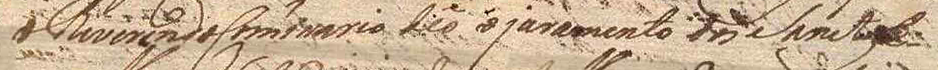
o Reverendo Com̄issario dêo o juramento dos Sanctos E
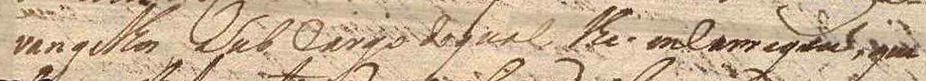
vangelhos Sub Cargo do qual lhe encarregaõ, que
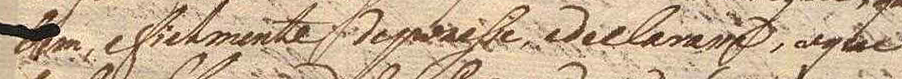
bem, e fielmente depozesse, e declarasse, o que
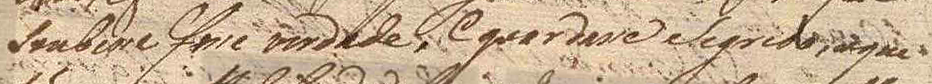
soubesse fosse verdade, E guardasse Segredo, o que
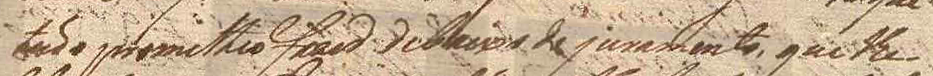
tudo prometteo fazer debaixo do juramento, que lhe
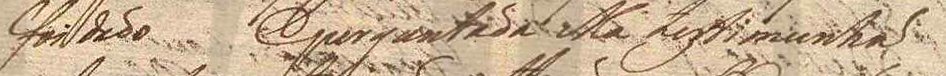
foi dado. E perguntada ella testimunha
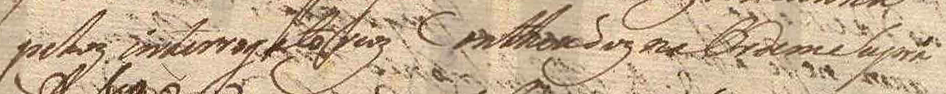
peloz interrogatorioz Contheudoz na Ordem Supra
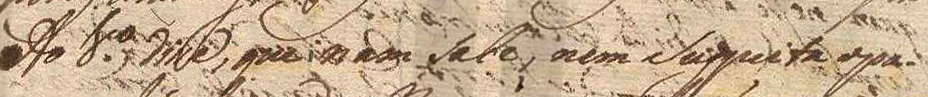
Ao 1.o, disse, que nam sabe, nem suspeita o pa
